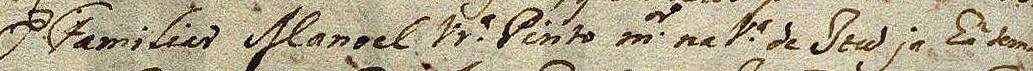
O Familiar Manoel Vr.a Pinto m.or na V.a de Itu já hâ tem
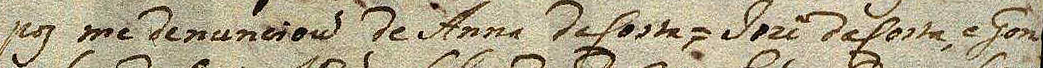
poz me denunciou de Anna da Costa= Iozé da Costa, e Gon
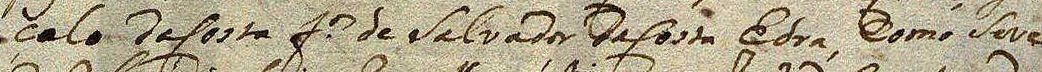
çalo da Costa f.os de Salvador da Costa Edra, Como se ve
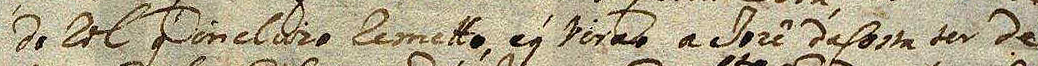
do Rol q̄ incluzo Remetto, e q̄ viraõ a Iozé da Costa ter de
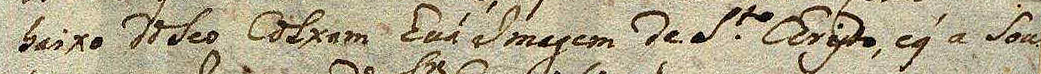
baixo do seo Colxam huā Imagem de S.to Christo, e q̄ aSou
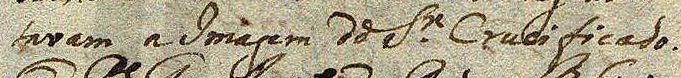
tavam a Imagem do S.r Crucificado.
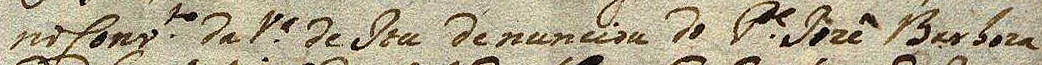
no Conv.to da V.a de Itu denunciou do P.e Iozé Barboza
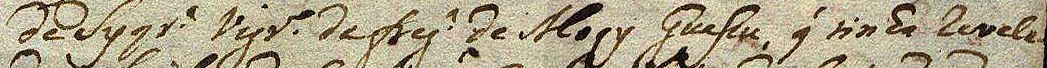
de Syqr.a Vigr.o de frega de Mogy Guassu, q̄ tinha Revela
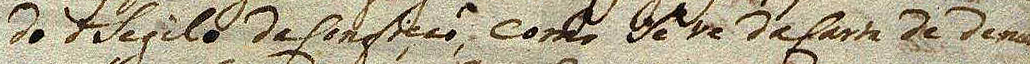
do o Segilo da Confiçaõ como se ve da Carta de denun
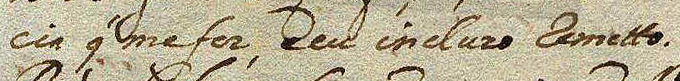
cia q̄ me fez e eu incluzo Remetto.
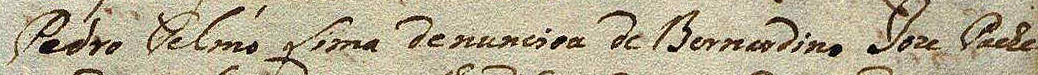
Pedro Telmo Lima denunciou de Bernardino Ioze Pache
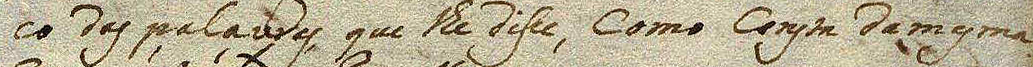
co das palavras que lhe disse como consta da mesma
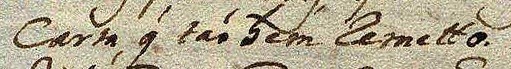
Carta q̄ taõbem Remetto.
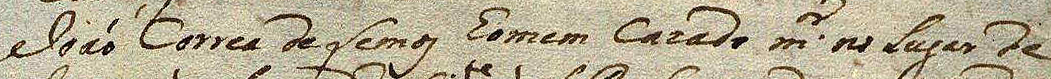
Ioaõ Correa de Lemos homem cazado m.or no Lugar de
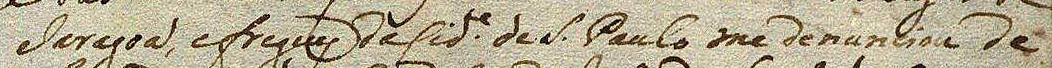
Iaragoa, e freguez da Cid.e de S. Paulo me denunciou de
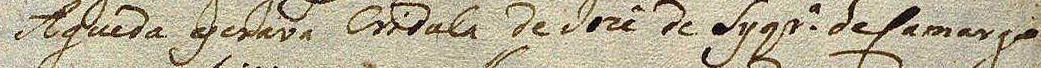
Agueda escrava Crioula de Iozé de Syqr.a de Camargo
